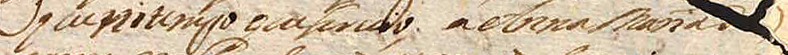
que no tempo que seruio, a Anna Maria de
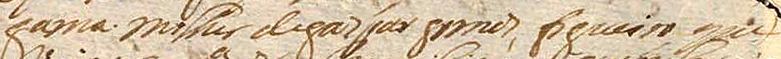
gama molher de gaspar gomes figueiro que
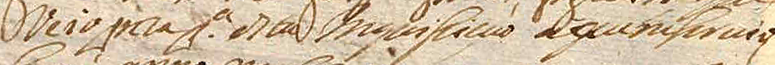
Veio preza p.a esta Inquisiçaõ a quem seruio
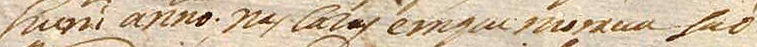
hum anno nas cazas em que moraua saõ
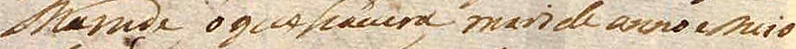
Mamde o que hauera mais de anno e meio
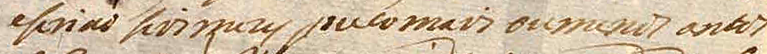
e seriaõ seis mezes pouco mais ou menos antes
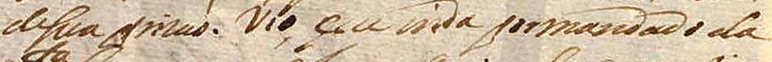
de sua prizaõ. Vio, que inda por mandado da
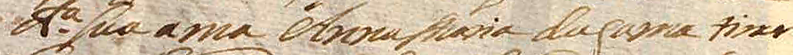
d̄.a sua ama Anna Maria de gama tirar
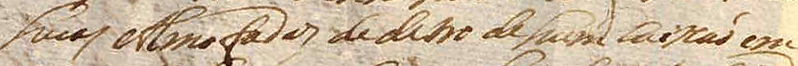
huas Almofadas de detro de hum caixaõ em
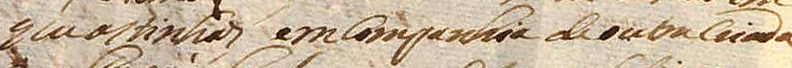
que as tinhaõ em companhia de outra criada
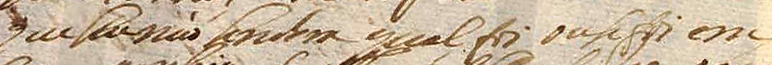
que lhe naõ lembra qual foi ou se foi em
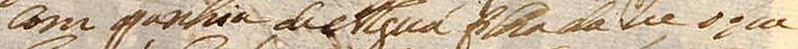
companhia de Alguã filha da re, o que
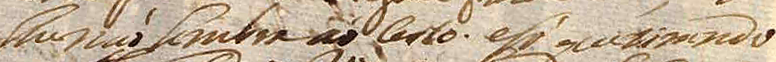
lhe naõ lembra ao certo e só quezimndo
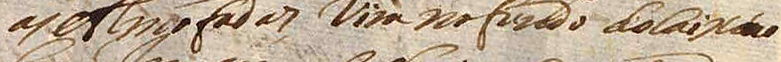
as Almofadas vira no fundo do caixão
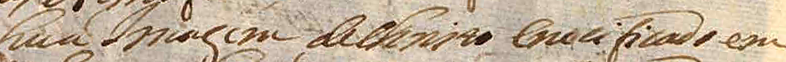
huā Imagem de christo crucificado em
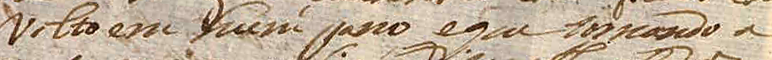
volto em hum̄ pano e que tornando a
